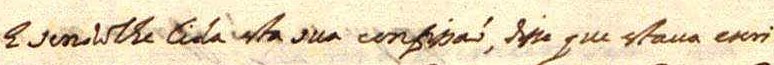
e sendo lhe lida esta confissaõ, disse que estaua escri
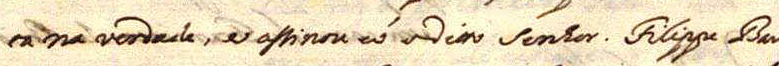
ta na verdade, e assinou cō o ditto Senhor. Filippe Bar
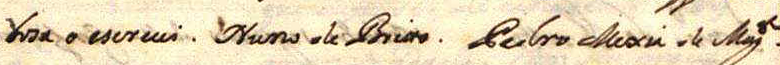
bosa o escrevi. Nuno de Britto. Pedro Mexia de Mag.s
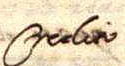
Credito
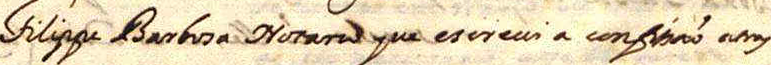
Filippe Barbosa notario que escreui a confissaõ atras
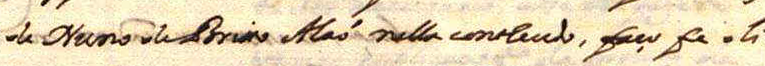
de Nuno de Britto Alaõ nella contheudo, faço fe di
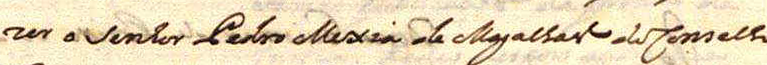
zer o Senhor Pedro Mexia de Magalhaes do Conselho
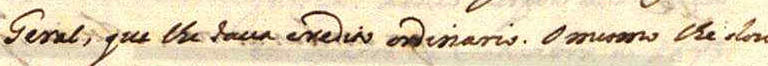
Geral, que lhe daua credito ordinario. O mesmo lhe dou
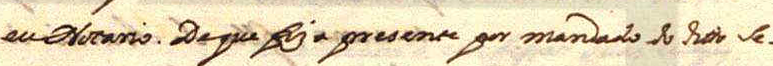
eu Notario, De que fiz a presente por mandado do ditto se
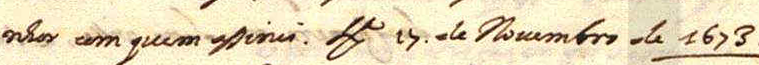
nhor com quem assinei. Lxa 17. de Nouembro de 1673.
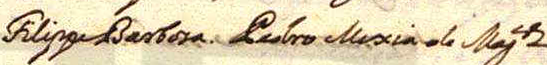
Filippe Barbosa. Pedro Mexia de Mages
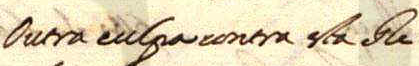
Outra culpa contra esta Re
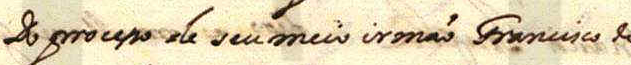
Do processo de seu meio irmaõ Francisco de
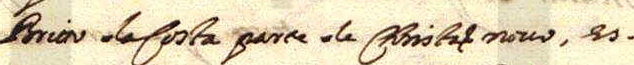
Britto da Costa parte de Christaõ nouo, es
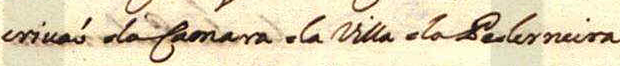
criuaõ da Camara da Villa da Pederneira
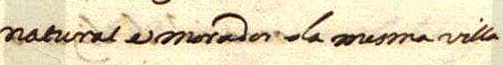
natural e morador da mesma villa
